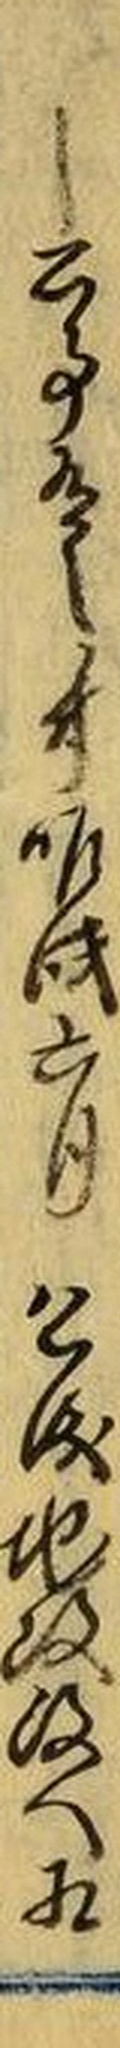之公事有之に付昨戌六月公儀地改役人相
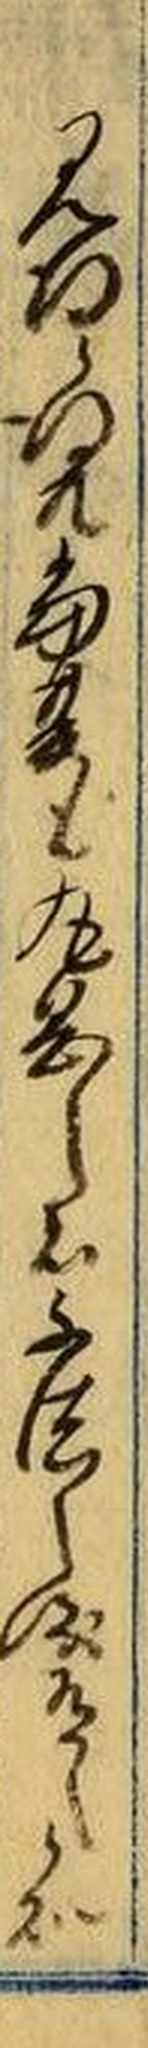見得候得共当夏も丸岡之者不法之儀有之候処
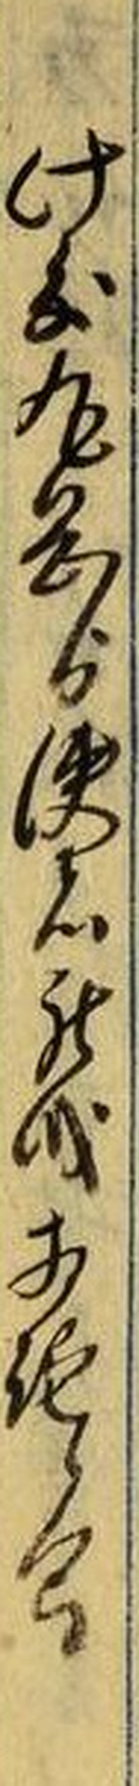此度丸岡ゟ使者罷越相絶候間
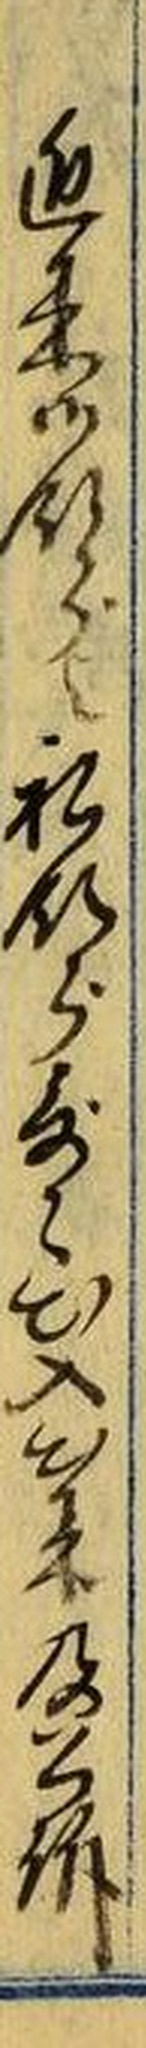近来御領分と私領分度々出入出来及公訴
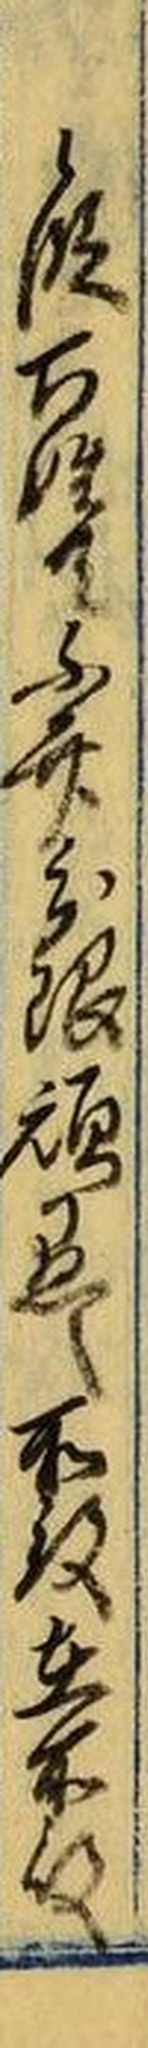之段百姓共不弁分限頑愚之所致在所役
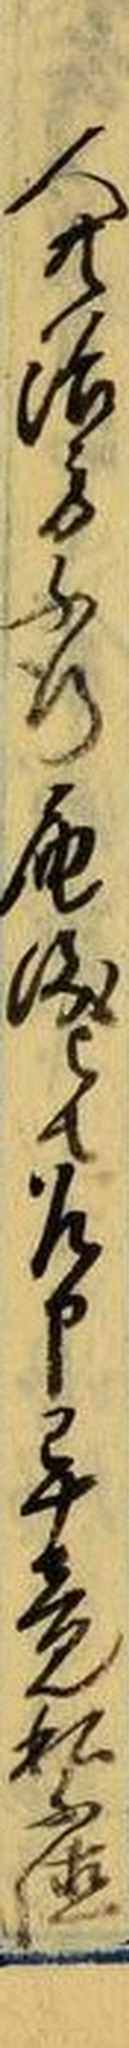人共話方不行届儀とは乍申畢竟私不徳
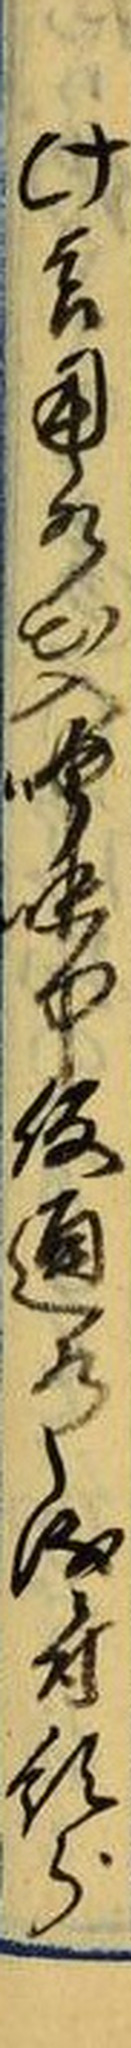此節用水出入吟味中仮通水之儀に付領分
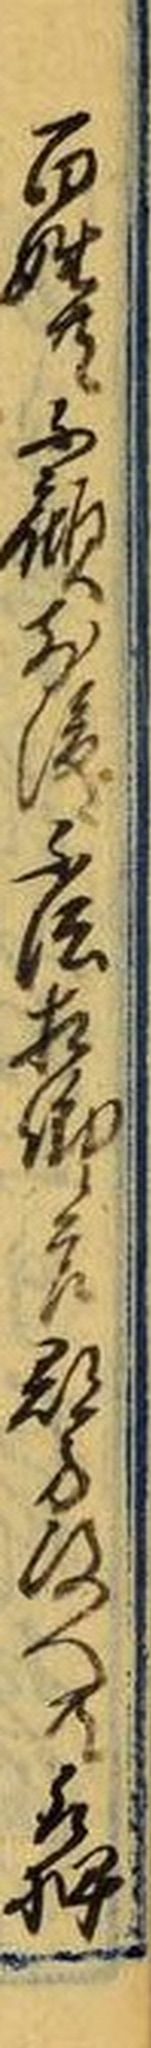百姓共不傾前後に不法相働節郡方役人共取押
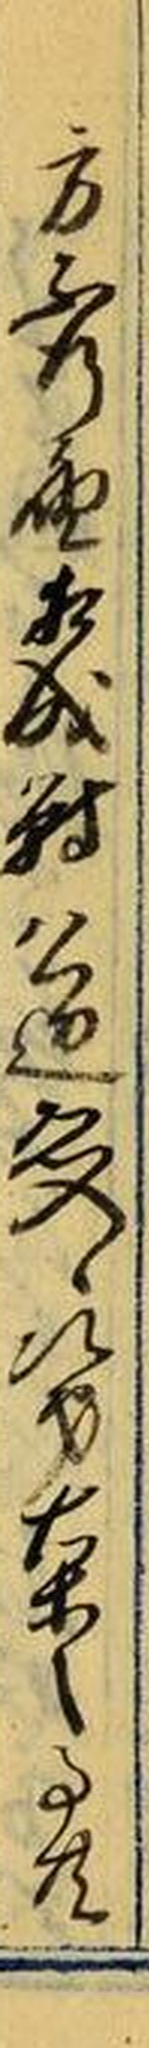方不行届相成対公辺恐入候次第右等之事共
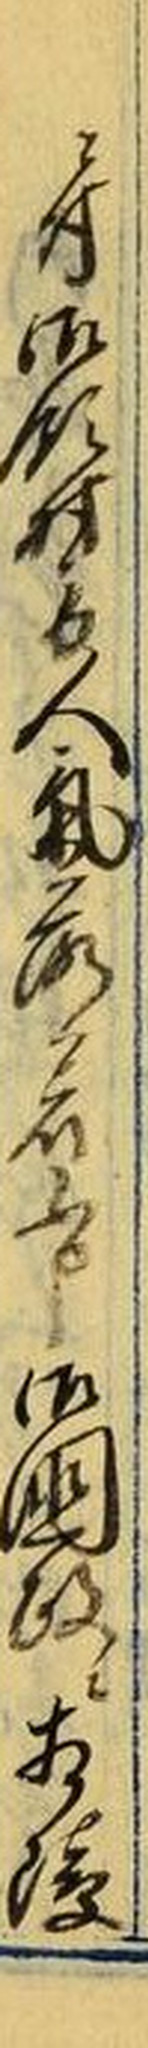に付御領村方人気落着不申御国改に相障
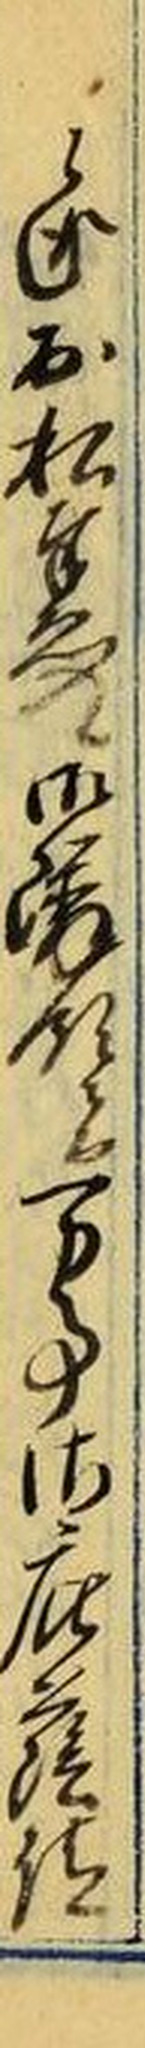候趣於私奉恐入候御隣領に而万事御庇護請
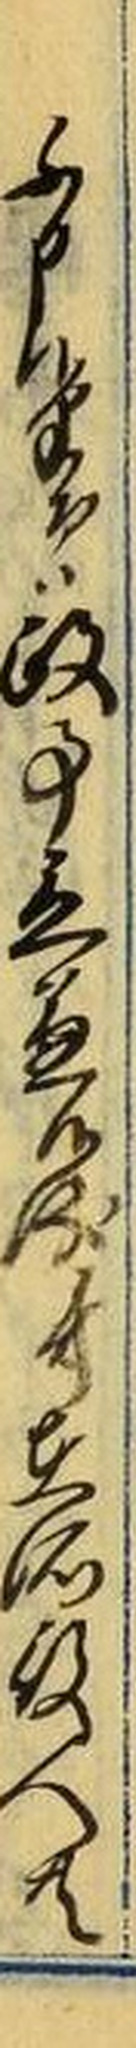不申候に而は政事立兼候儀に付在所役人共
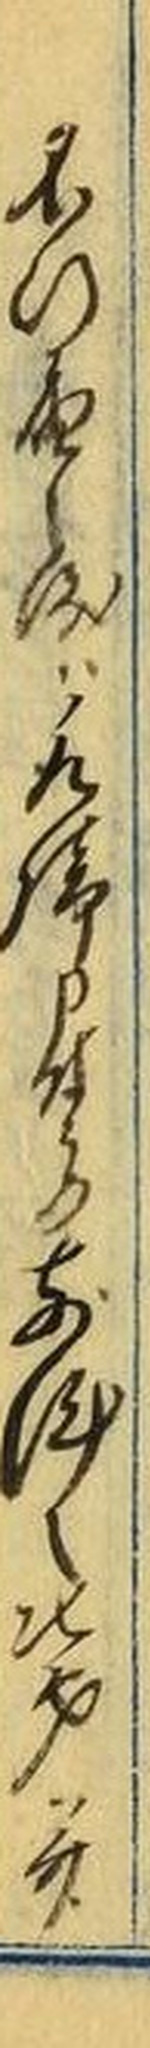不行届之儀は取締申付に付前件之次第并
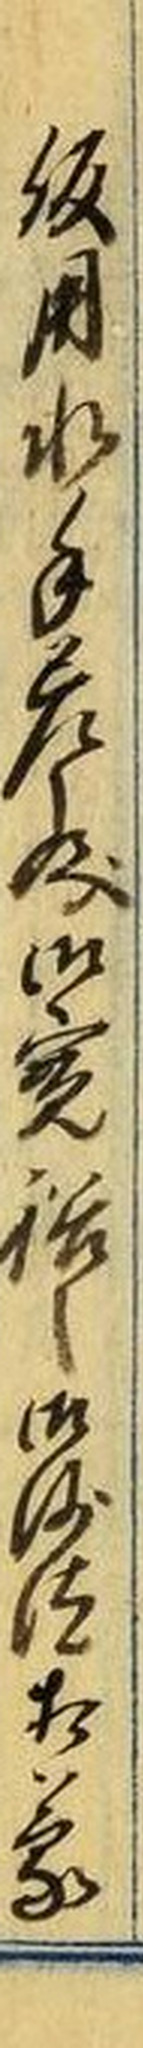仮用水手差之儀御寛裕之御沙汰相蒙
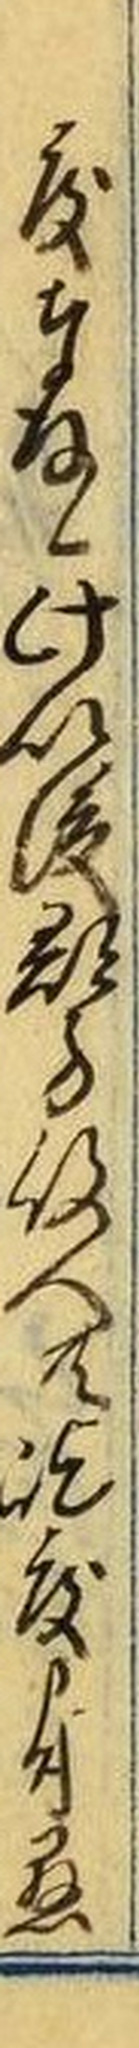度奉存候此以後郡方役人共屹度申付懸
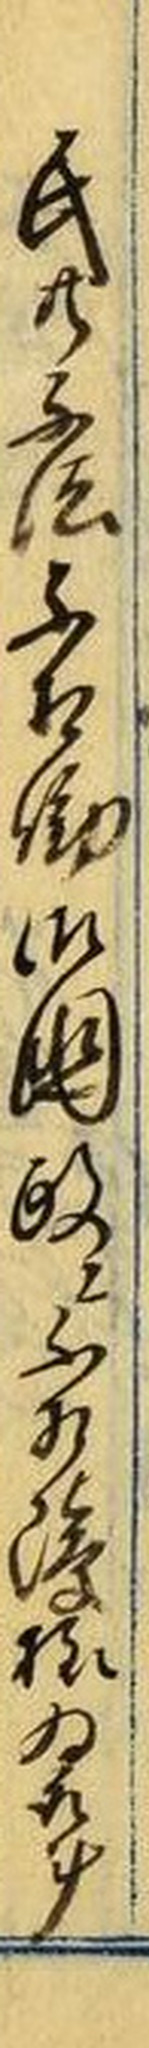氏共不法不相働御国改に不相障様為取計
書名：温古集 五巻
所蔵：福井県文書館 Fukui Prefectural Archives
